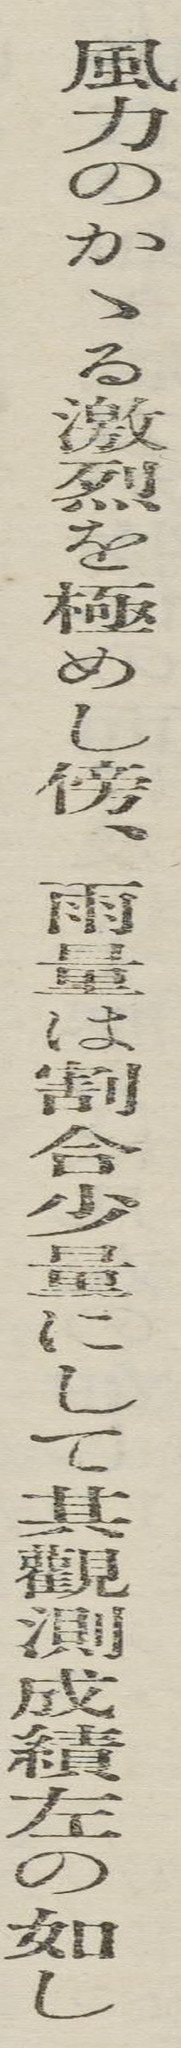風力のかゝる激烈を極めし傍、雨量は割合少量にして其観測成績左の如し
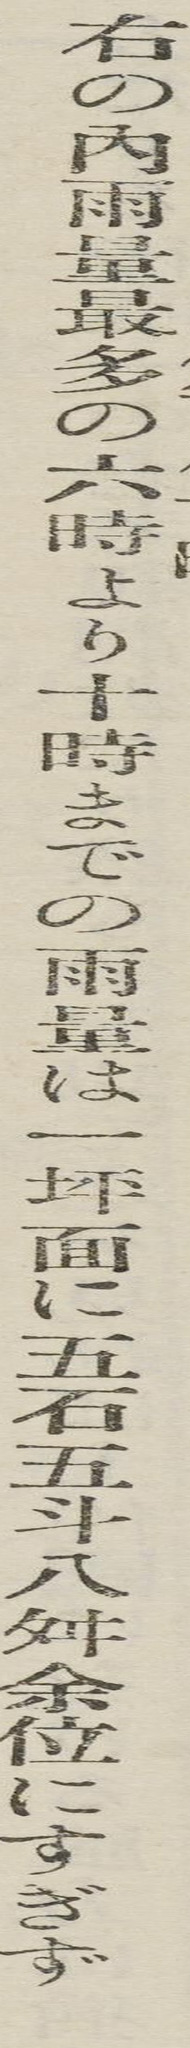右の内雨量最多の六時より十時までの雨量は一坪面に五石五斗八升余位にすぎず
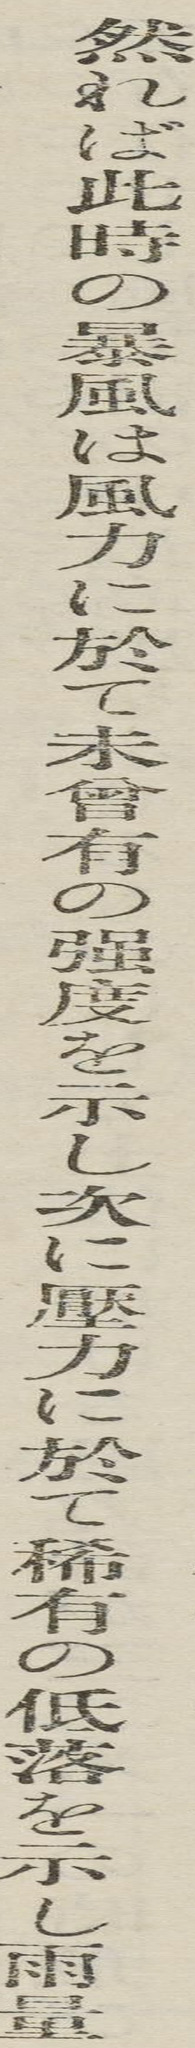然れば此時の暴風は風力に於て未曾有の強度を示し次に圧力に於て稀有の低落を示し雨量
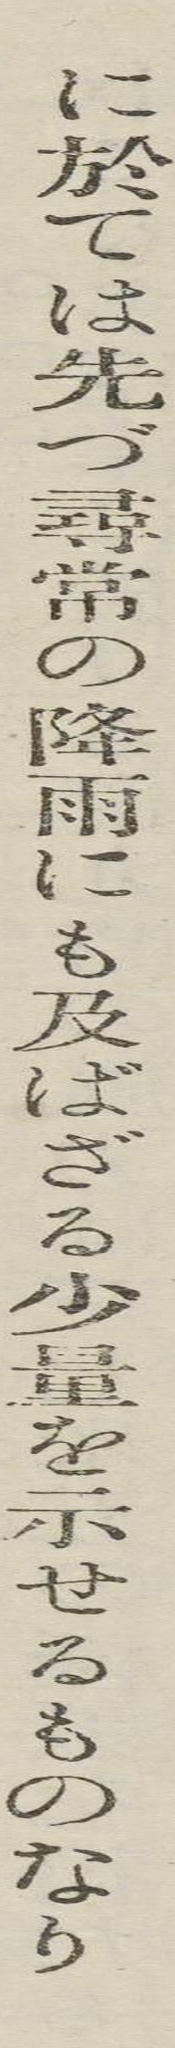に於ては先づ尋常の降雨にも及ばざる少量を示せるものなり
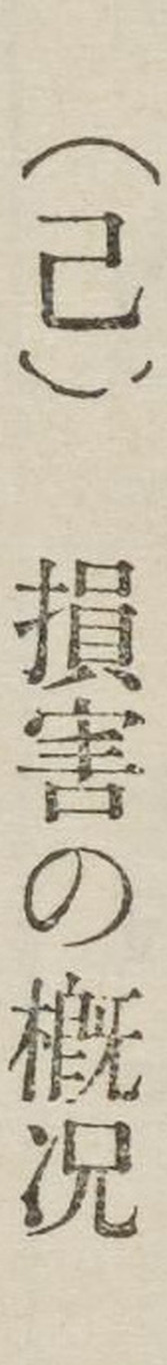損害の概況
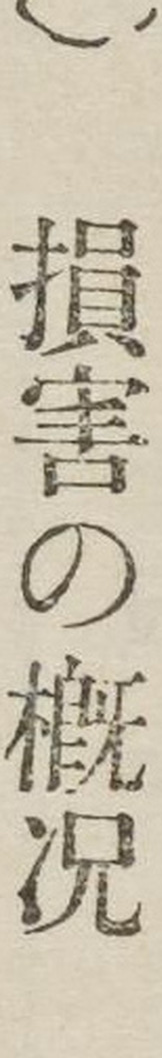損害の概況
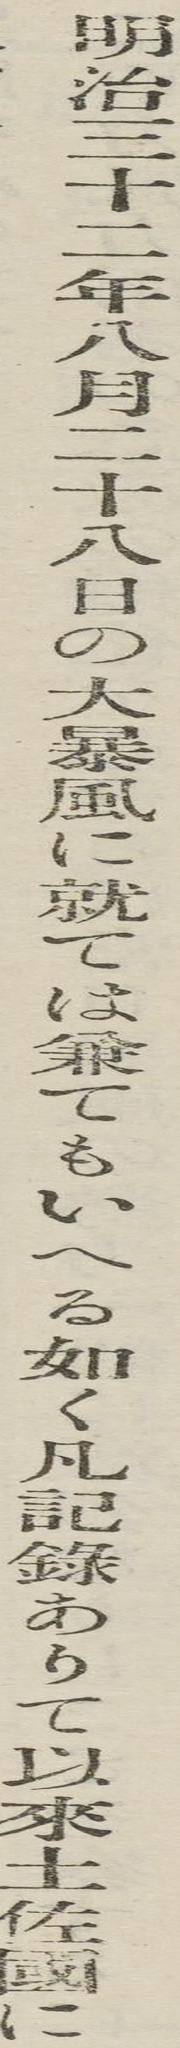明治三十二年八月二十八日の大暴風に就ては兼てもいへる如く凡記録あり以来土佐国に
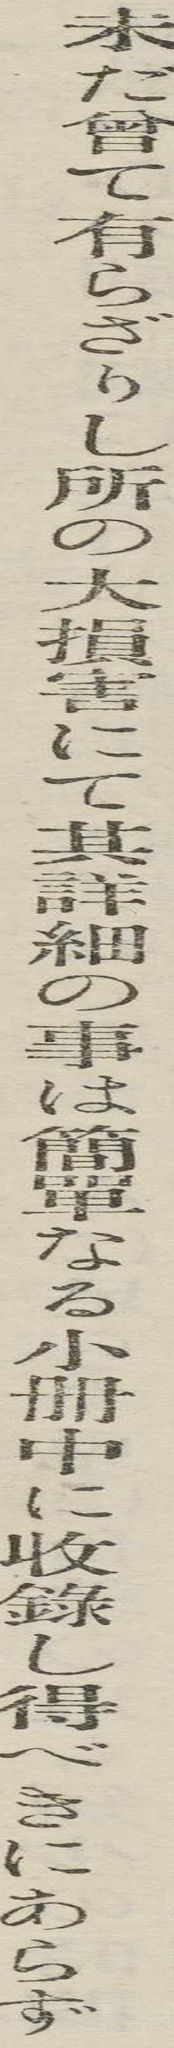未だ曾て有らざりし所の大損害にて其詳細の事は簡単なる小冊中に収録し得べきにあらず
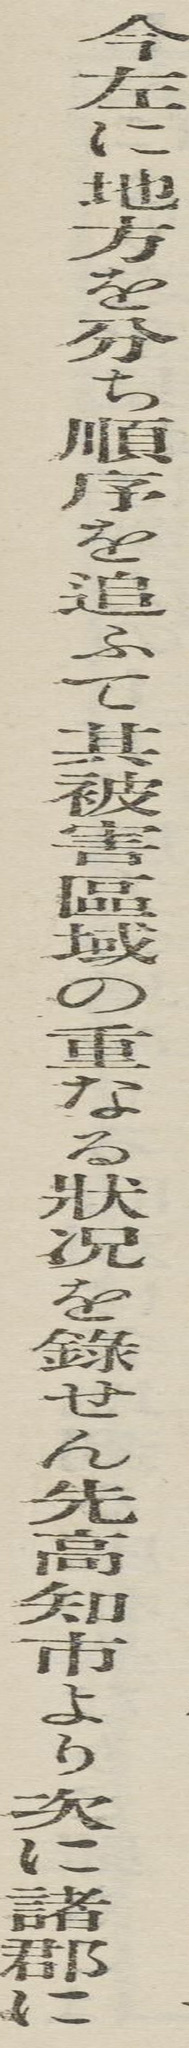今左に地方を分ち順序を追ふて其被害区域の重なる状況を録せん先高知市より次に緒郡に
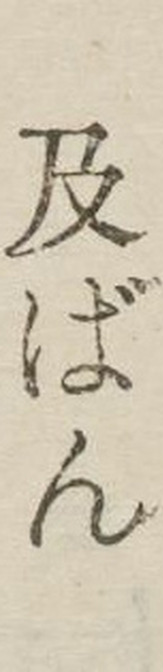及ばん
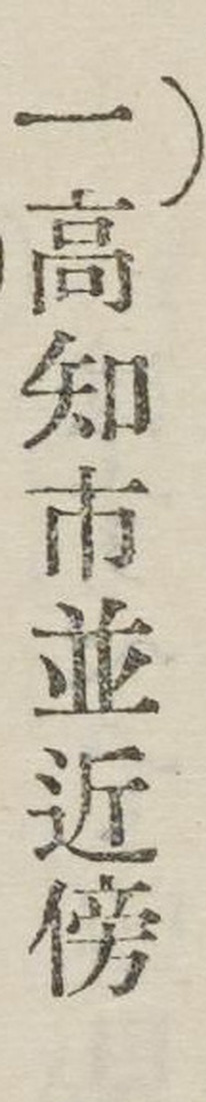高知市並近傍
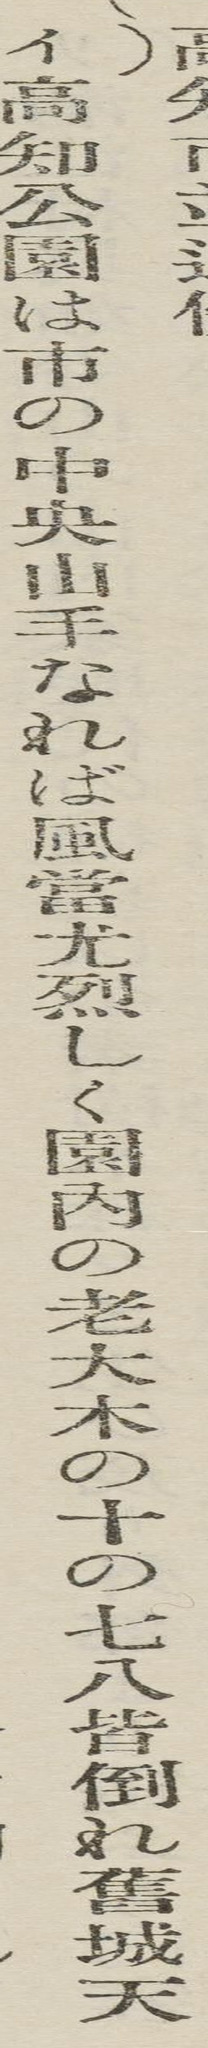高知公園は市の中央山手なれば風当尤烈しく園内の老大木の十の七八皆倒れ旧城天
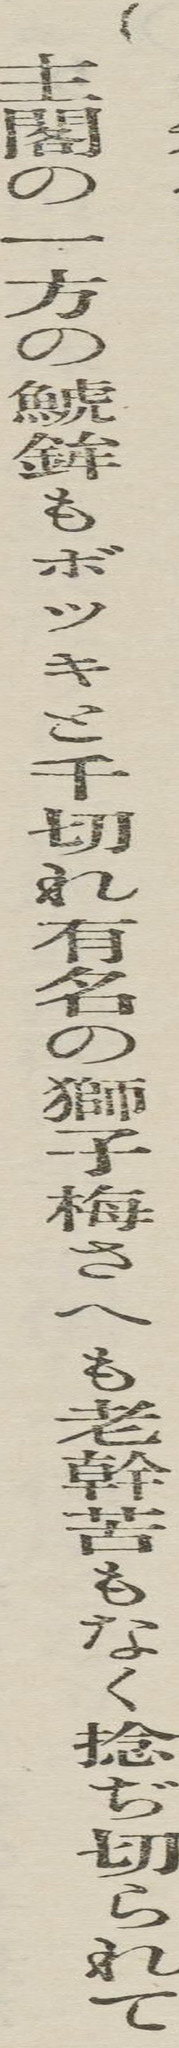主閣の一方の鯱鉾もボツキと千切れ有名の獅子梅さへも老幹苦もなく捻ぢれ切られて
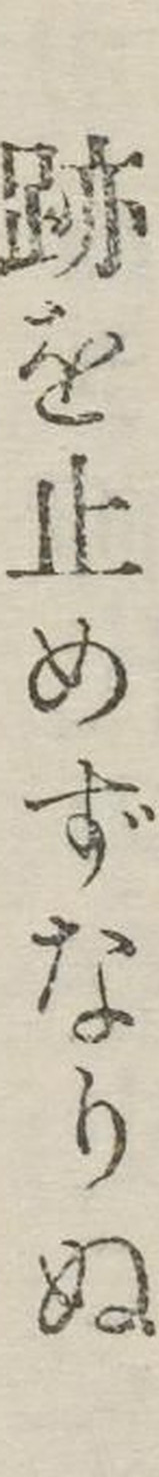跡を止めずなりぬ
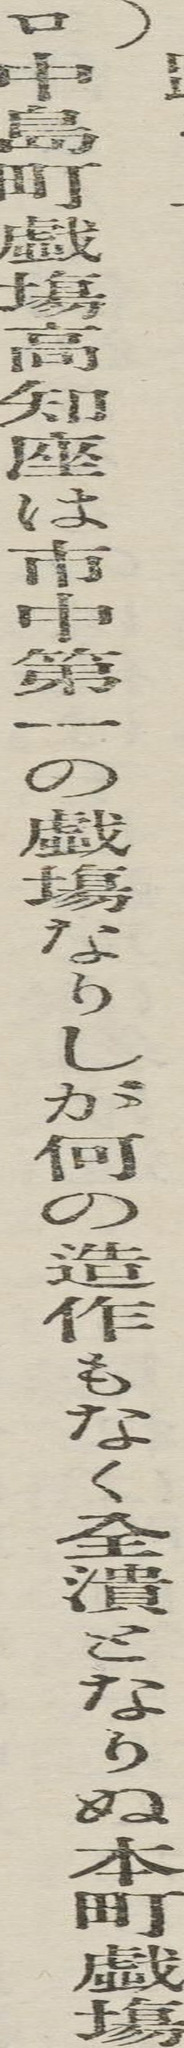中島町戯場高知座は市中第一の戯場なりしが何の造作もなく全潰となりぬ本町戯場
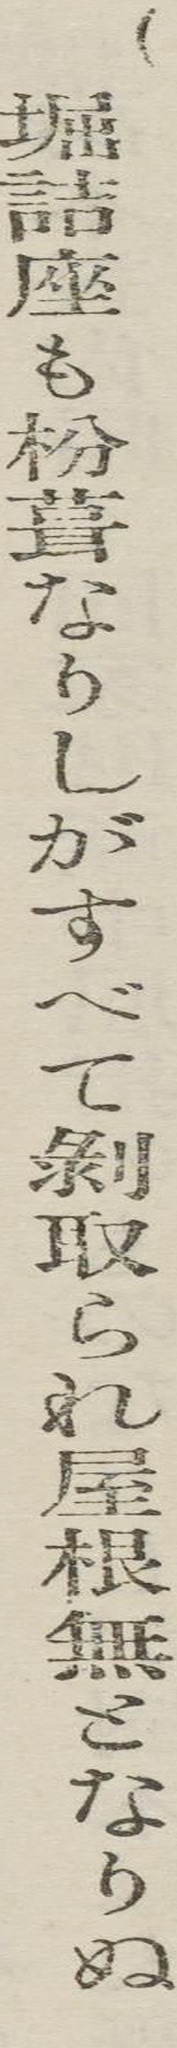堀詰座も枌茸なりしがすべて剥取られ屋根無となりぬ
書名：土佐古今ノ地震
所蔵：東京大学地震研究所図書室 Earthquake Research Institute Library, The University of Tokyo, JAPAN
